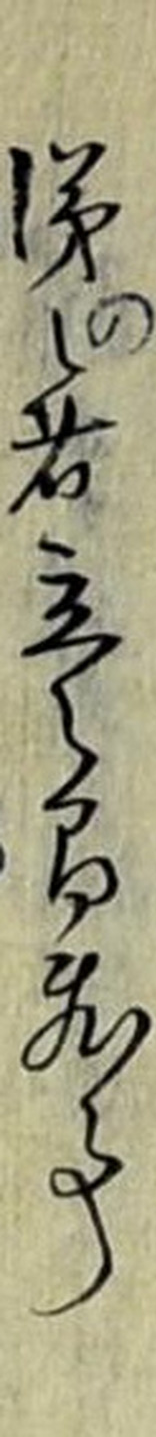悌之者立之間敷事
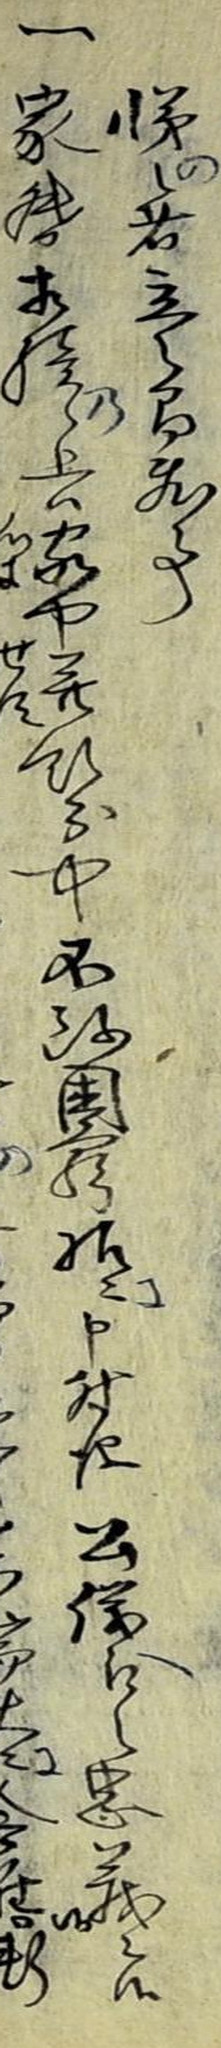一家督相続之上ハ家中并領分中不致困窮様ニ申付儀公儀江之忠義ニ候
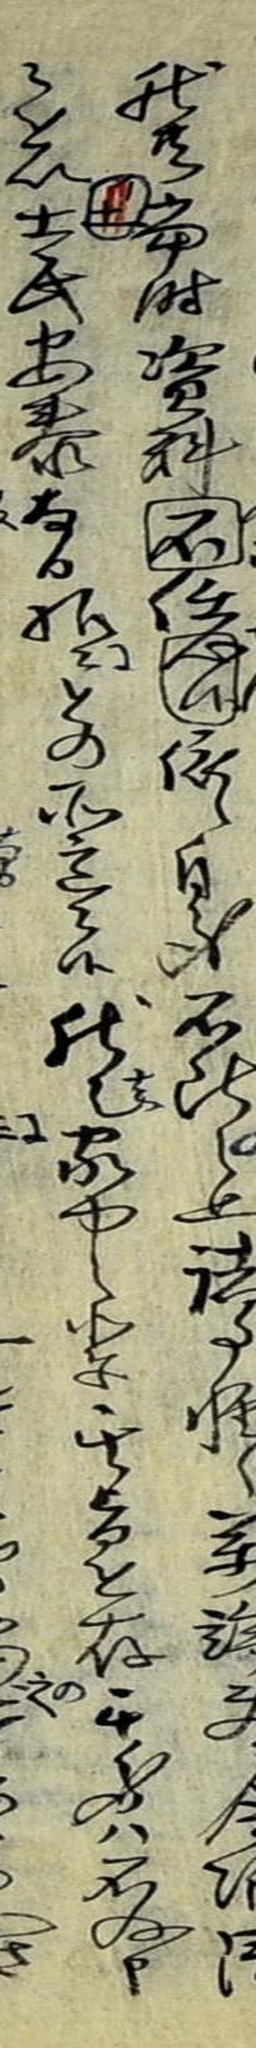々を以士民安泰なる様ニとの所意ニ候然し家中之輩其旨を存其身ハ不及申
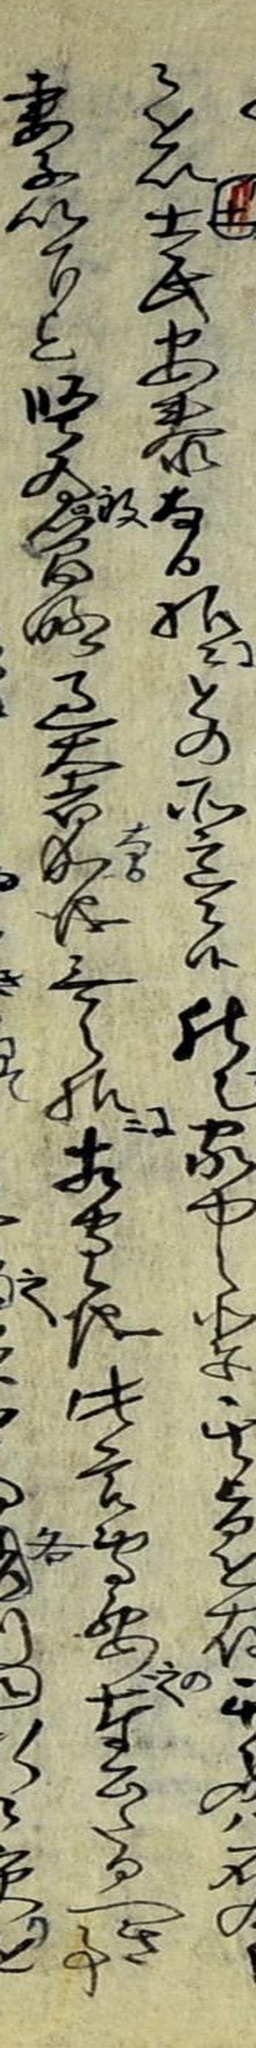妻子以下迄堅為◦致簡略過奢成儀無之様ニ相守候儀此節専要之奉公たるへき事
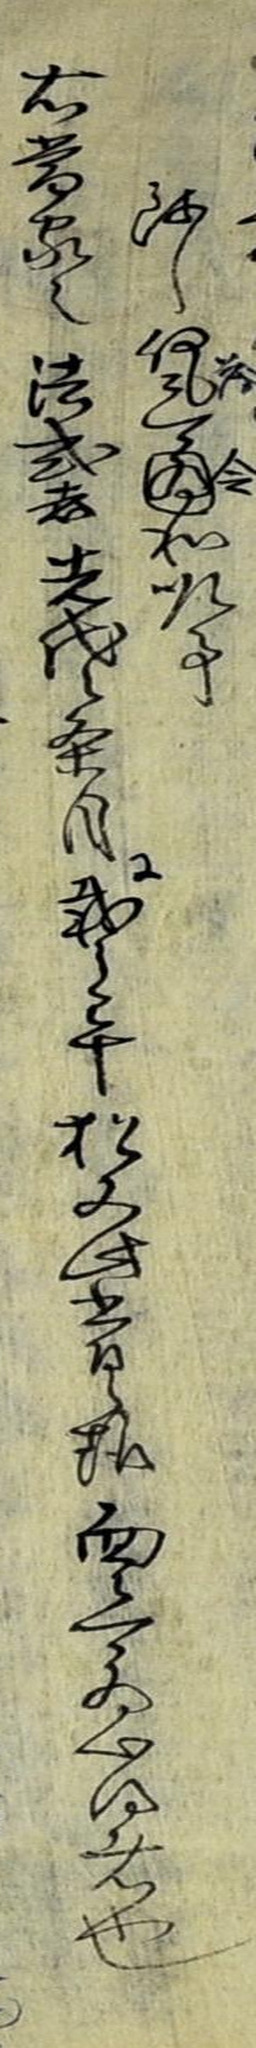右当家之法式者先代之条目に載候畢猶又此書付之趣面々可為心得者也
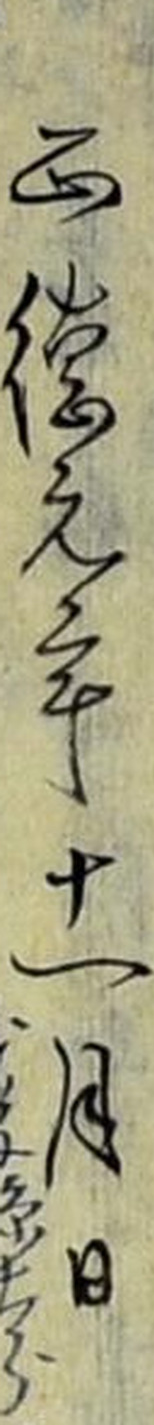正徳元年十一月日
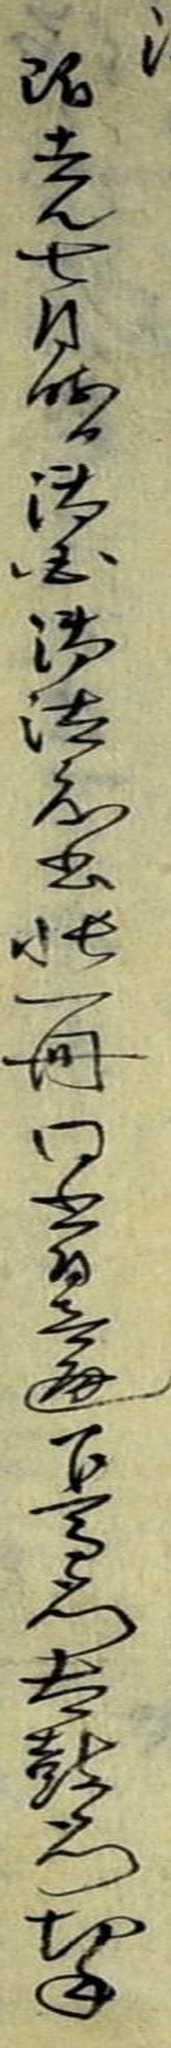附去ル七月晦日御国御法度書帳一冊同書付壱通下馬御門太鼓御門切手
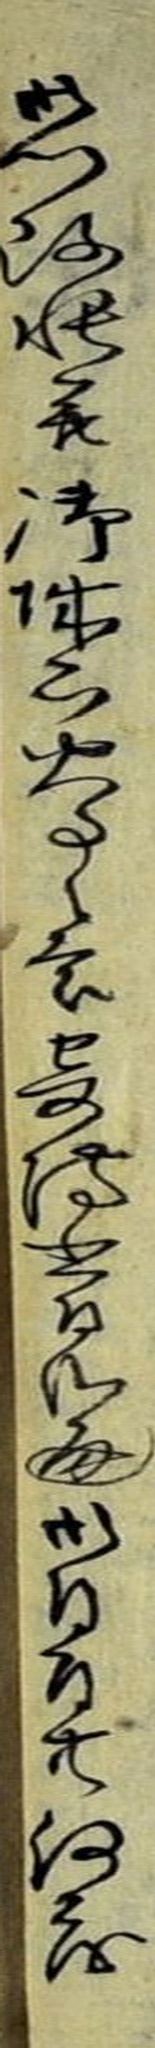御門改帳并御城下火事之節寄場書付弐通御目付共何茂
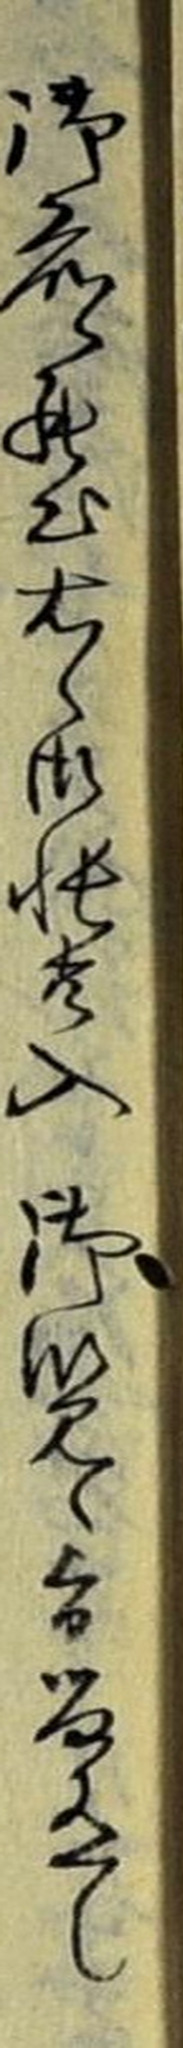御前へ罷出右之御帳共入御覧候旨留有之
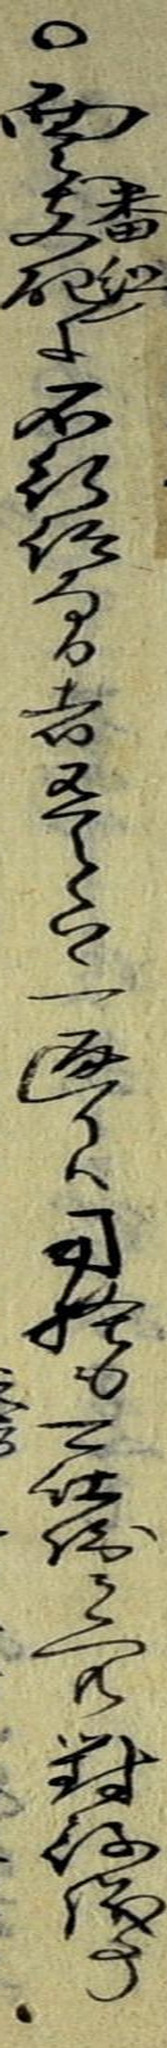〇面々支配に不行跡なる者有之候ハヽ一通りハ用捨も可仕例ニ候得共対役儀事
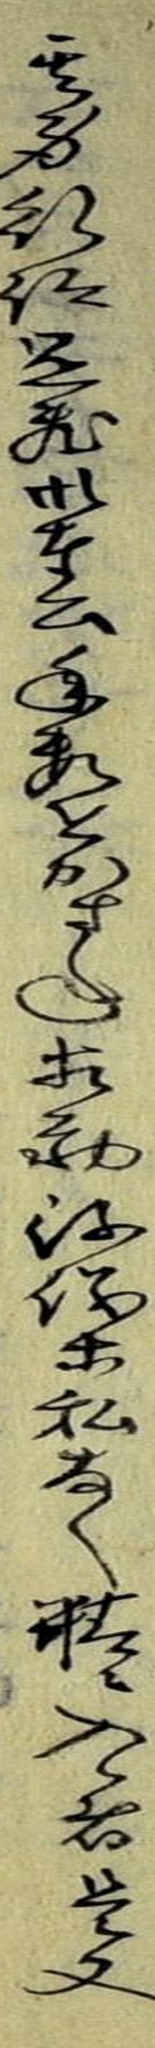其身行跡宜敷御奉公年数をかさね相勤役儀等私なく精ニ入候者是又
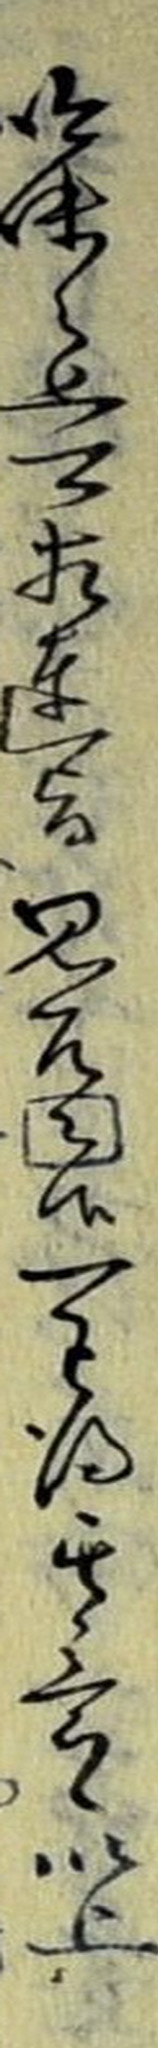吟味之上可相達旨思召ニ候可被為其意候以上
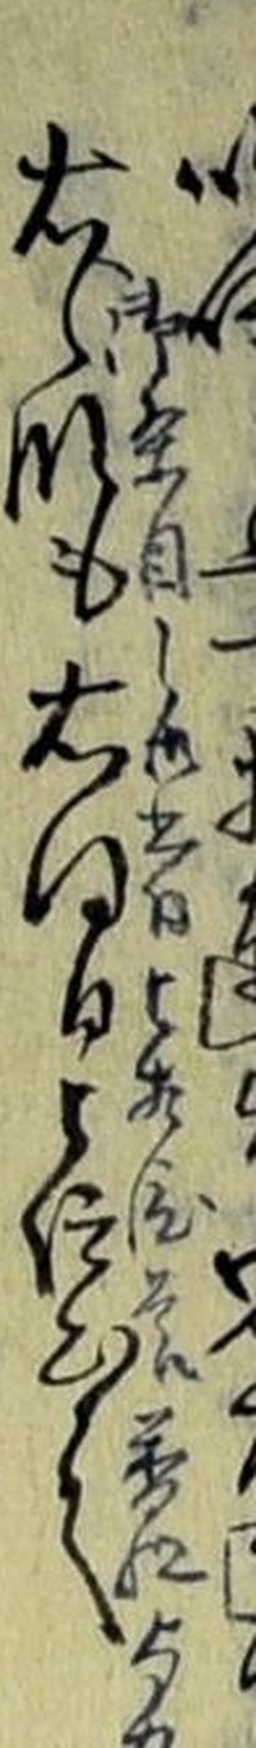右之段も右同日被仰出之
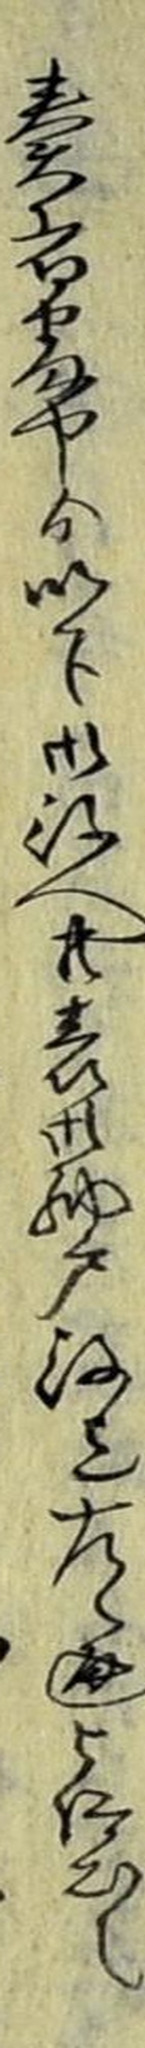奏者番中ゟ以下御役人共表御納戸役迄左之通被仰出之
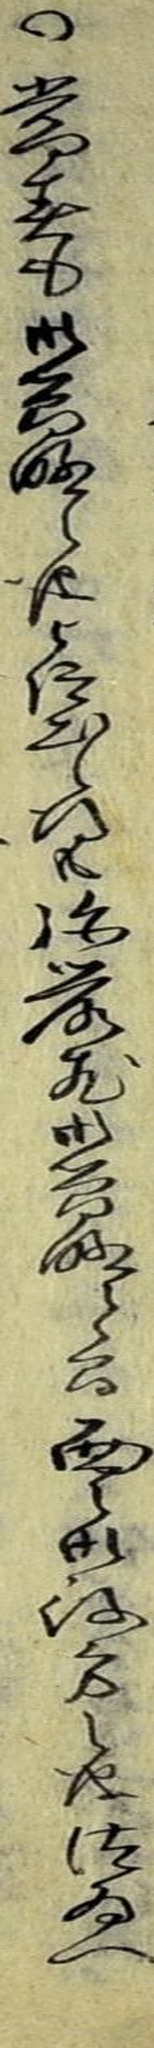〇当春も御簡略之儀被仰出候得共弥厳敷御簡略ニ候間面々御役方之儀つゐへ
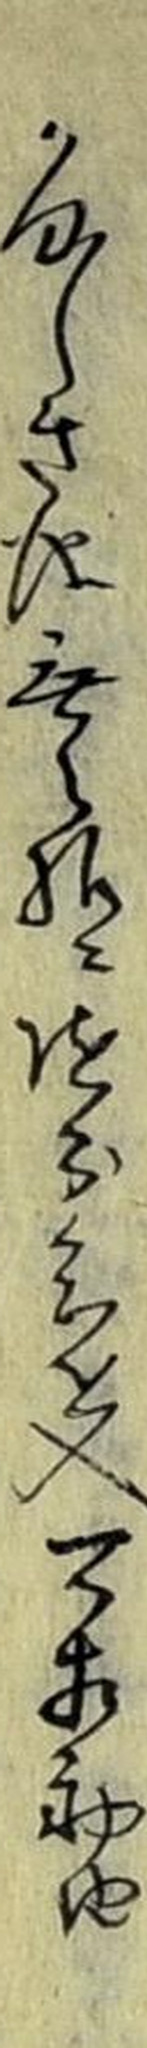かましき儀無之様ニ随分念を入可相勤由
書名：命令之部 一
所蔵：福井県文書館 Fukui Prefectural Archives
